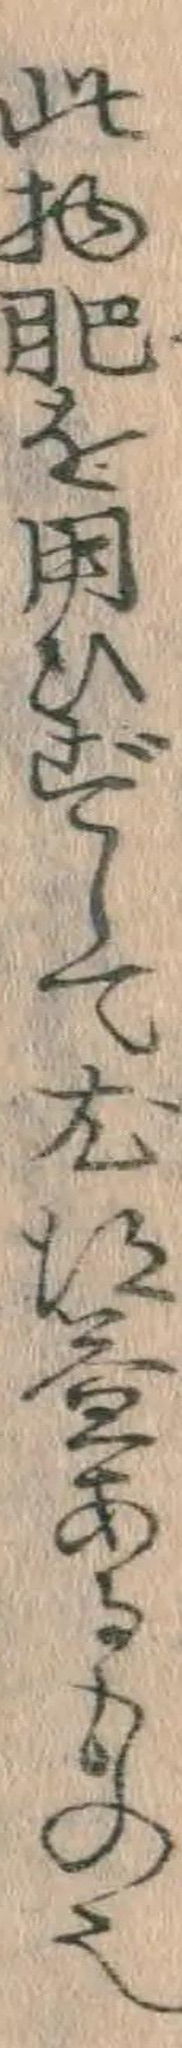此物肥を用ひずして尤得益あるもの也
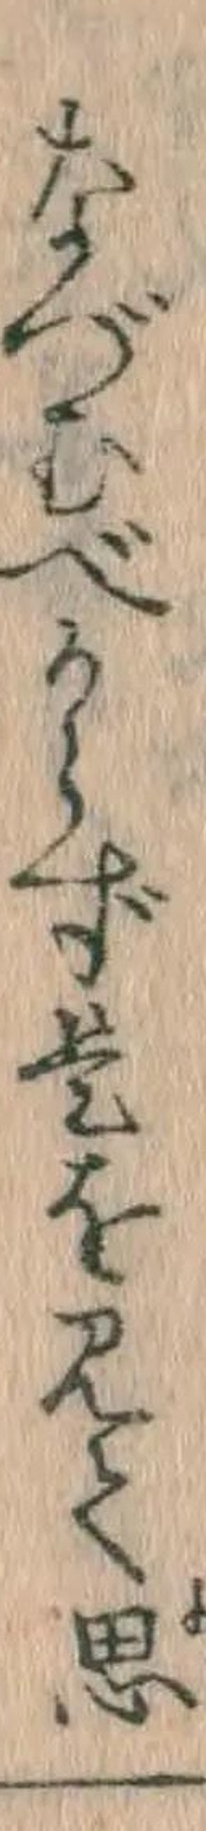なづむべからず是を見て思
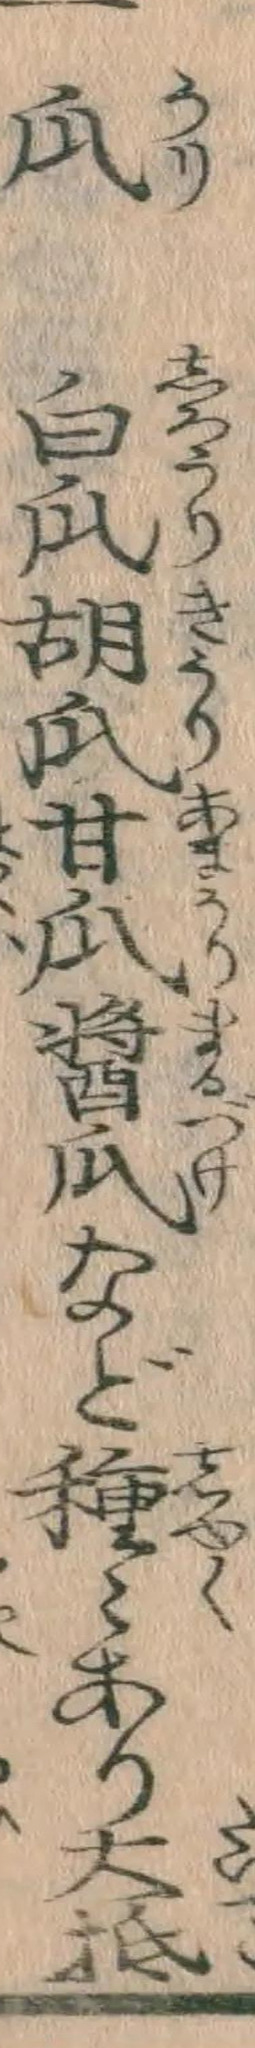一瓜白瓜胡瓜甘瓜醬瓜など種々あり大抵
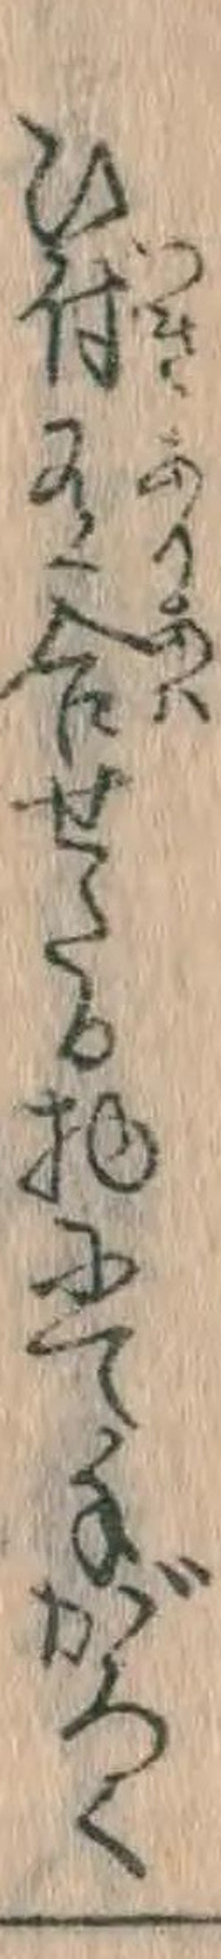ひ付有合せたる物にて手がろく
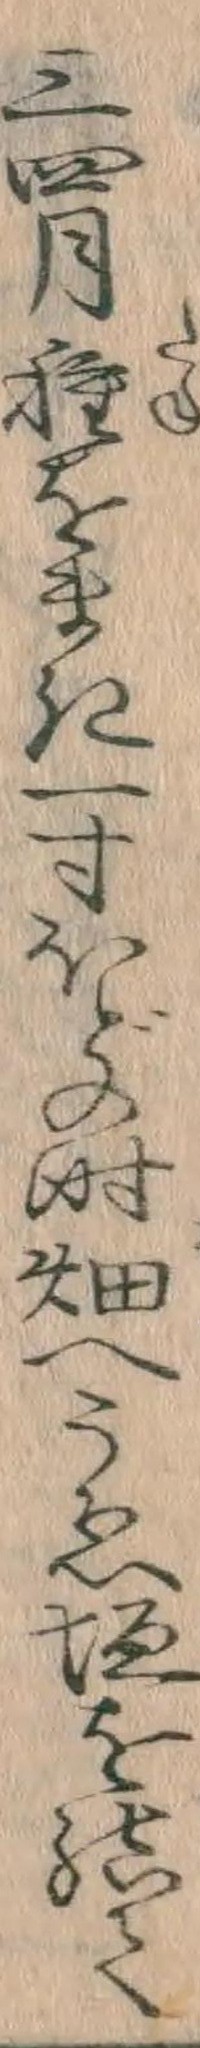三四月種をまき一寸ほどの時畑へうゑ垣を結て
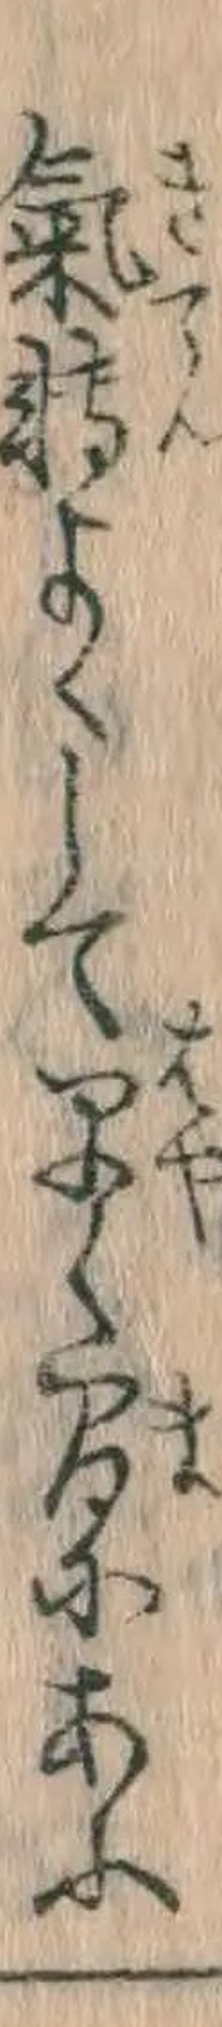気転よくして早く間にあふ
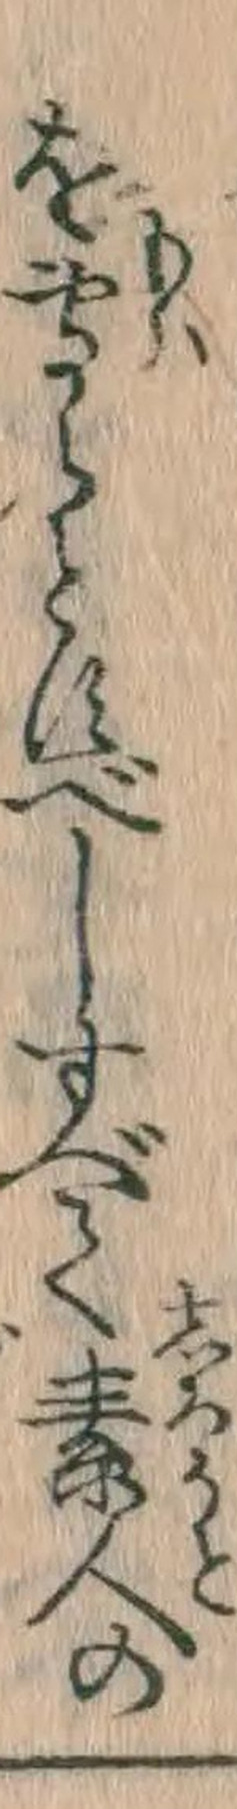を専らとすべしすべて素人の
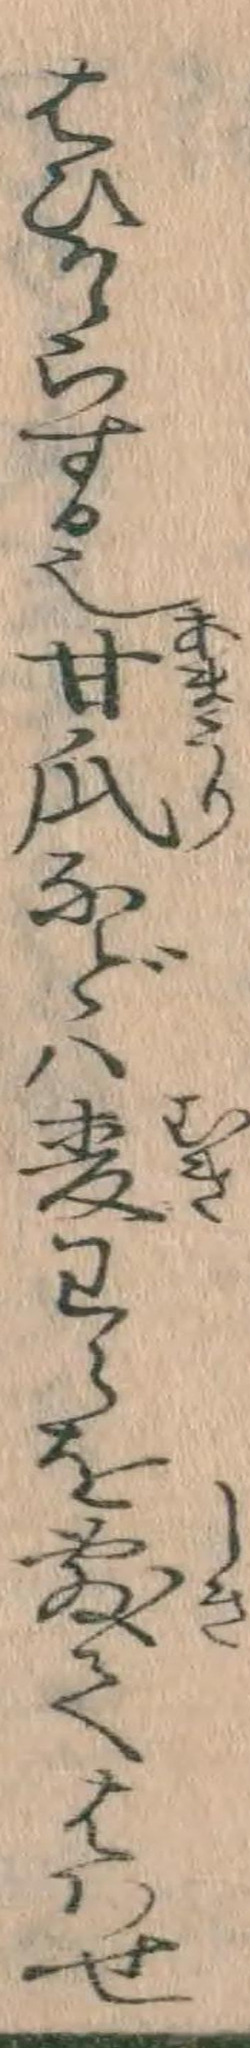はひかゝらする也甘瓜などは麦わらを敷てははせ
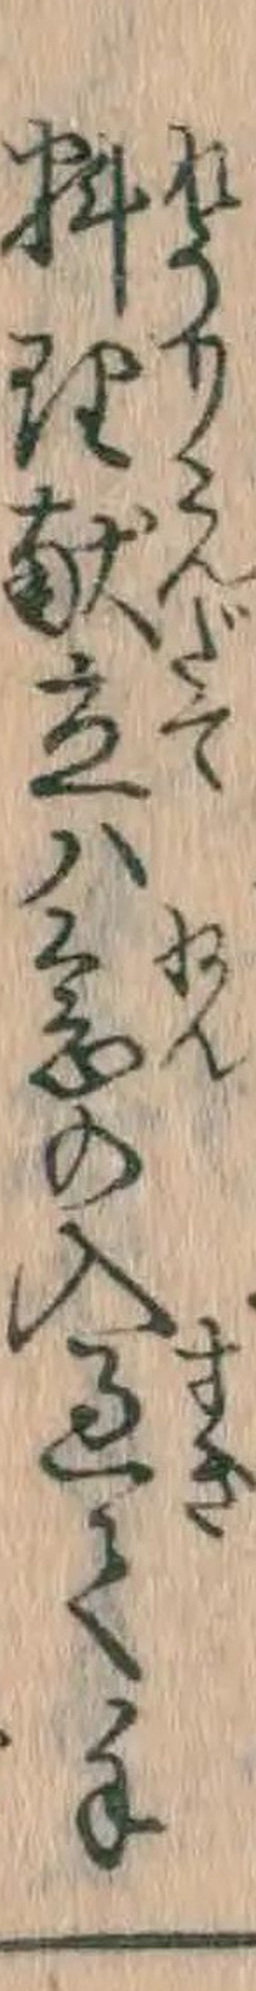料理献立は念の入過て手
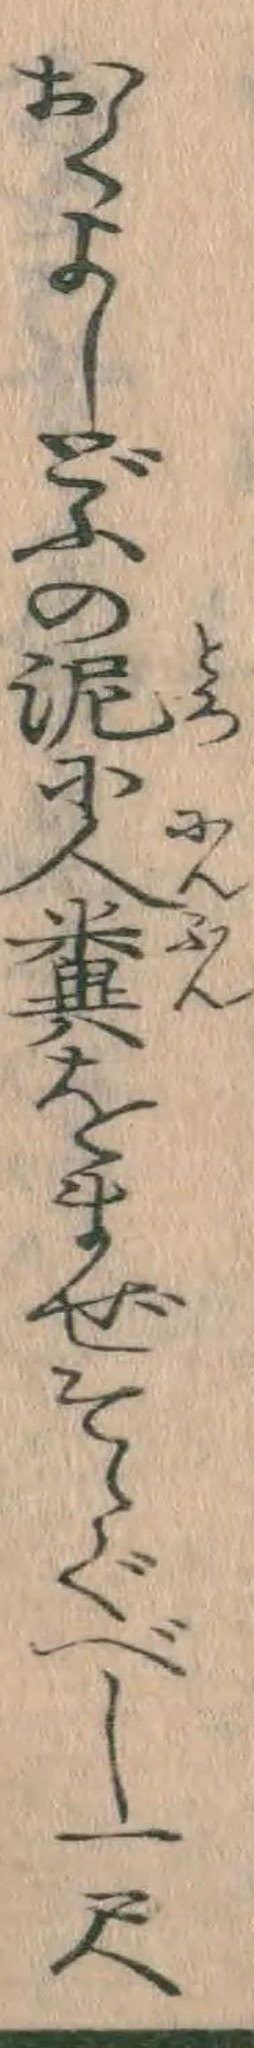おくよしどふの泥に人糞をまぜそゝぐべし一尺
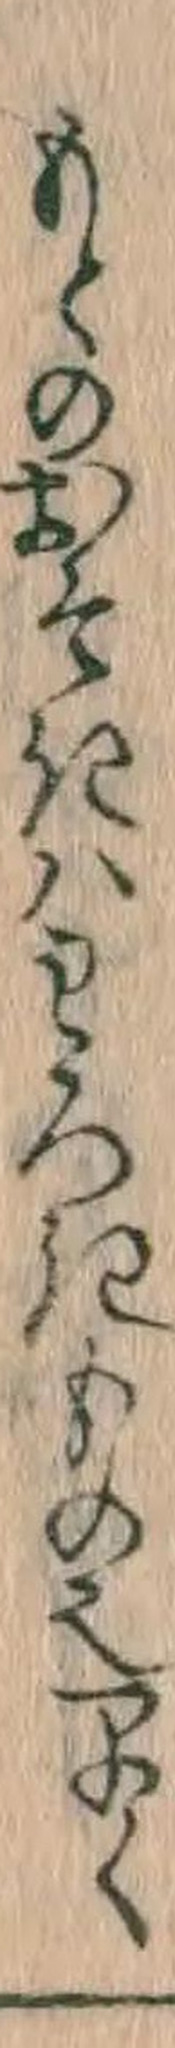もとのおそきはわろきもの也早く
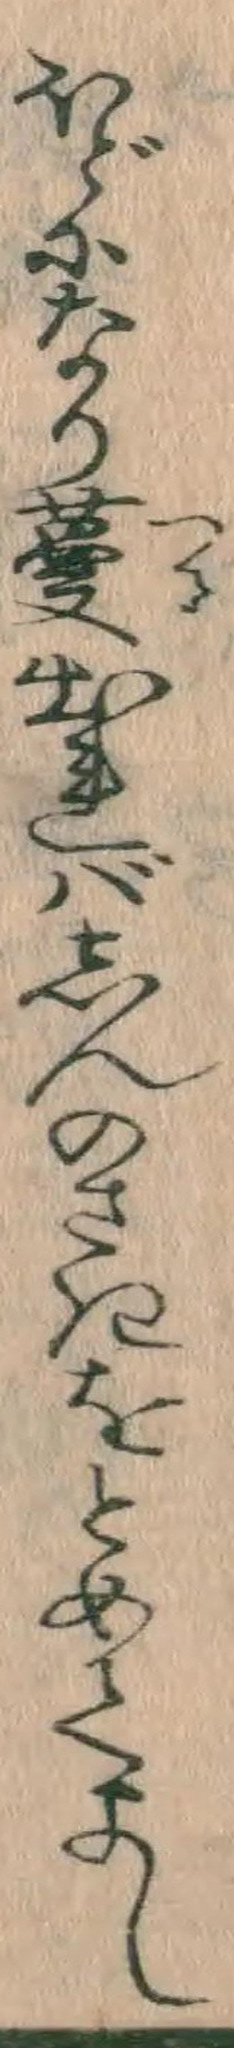ほどになり蔓出ればしんのさきをとめてよし
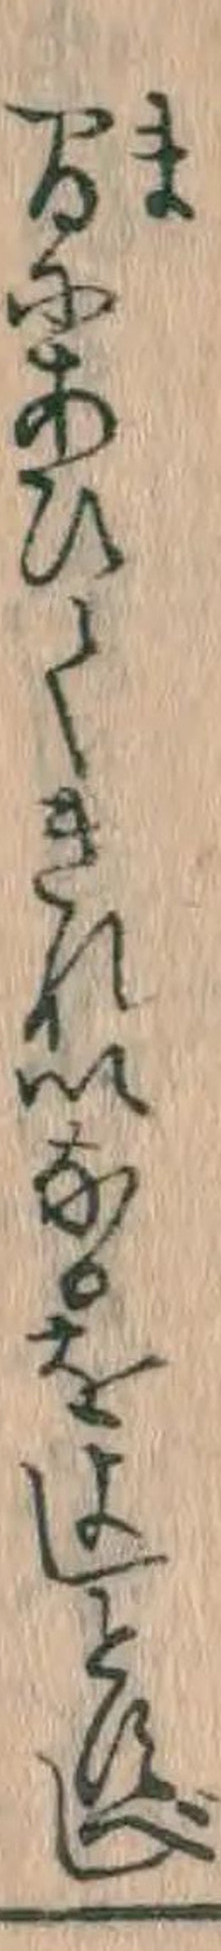間にあひてきれいなるをよしとすべし
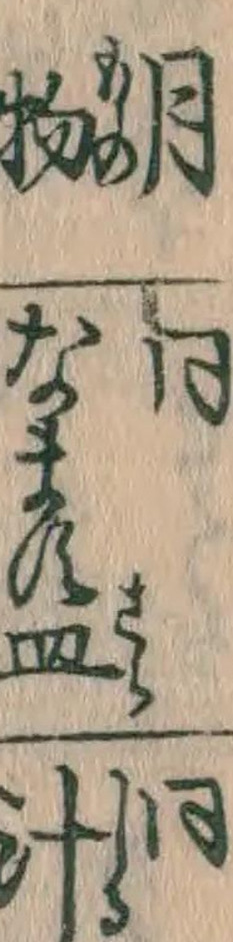煮物なます皿汁
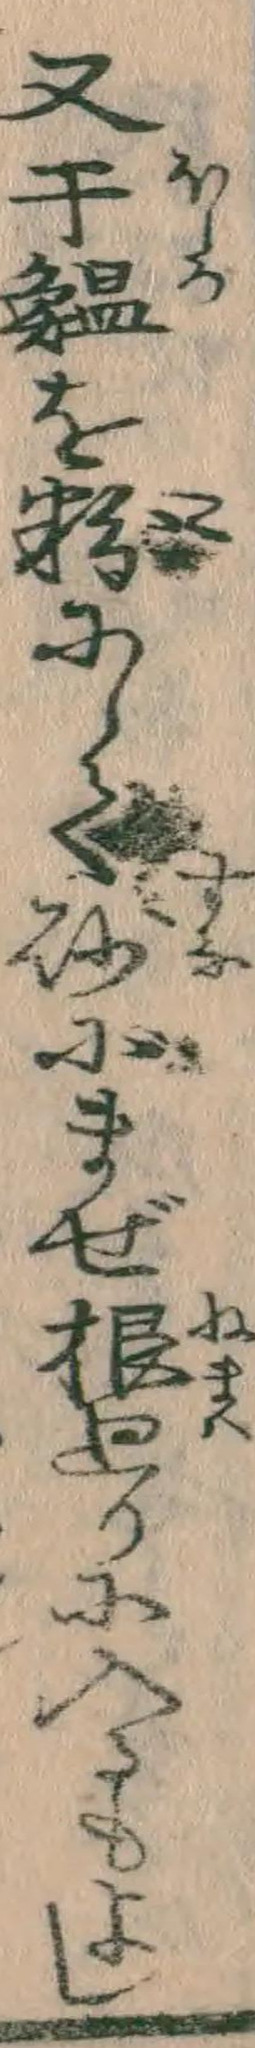又干鰮を粉にして砂にまぜ根廻りに入るもよし
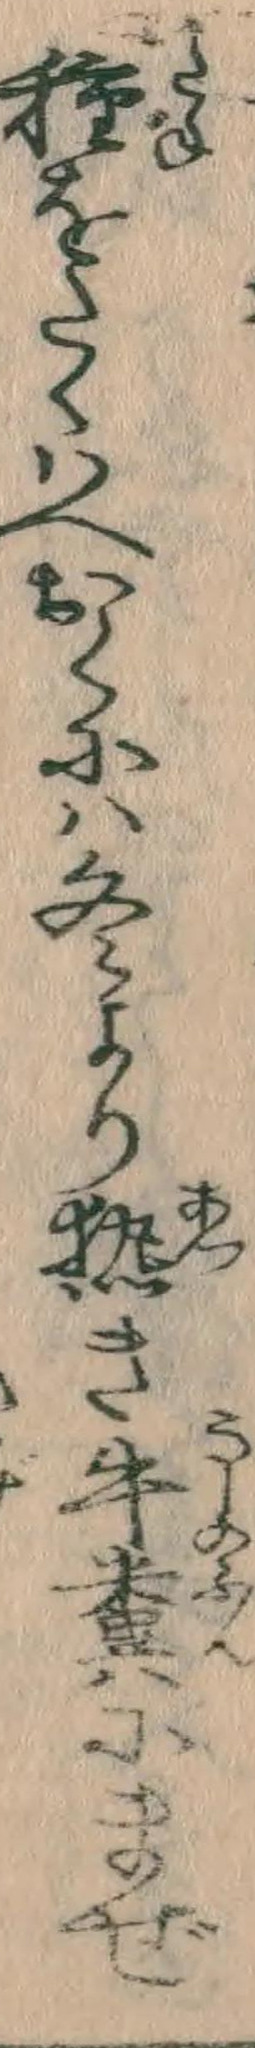種をたくはへおくには冬より熱き牛糞にまぜ
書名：広益秘事大全 3巻. [5]
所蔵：国立国会図書館 National Diet Library, JAPAN
